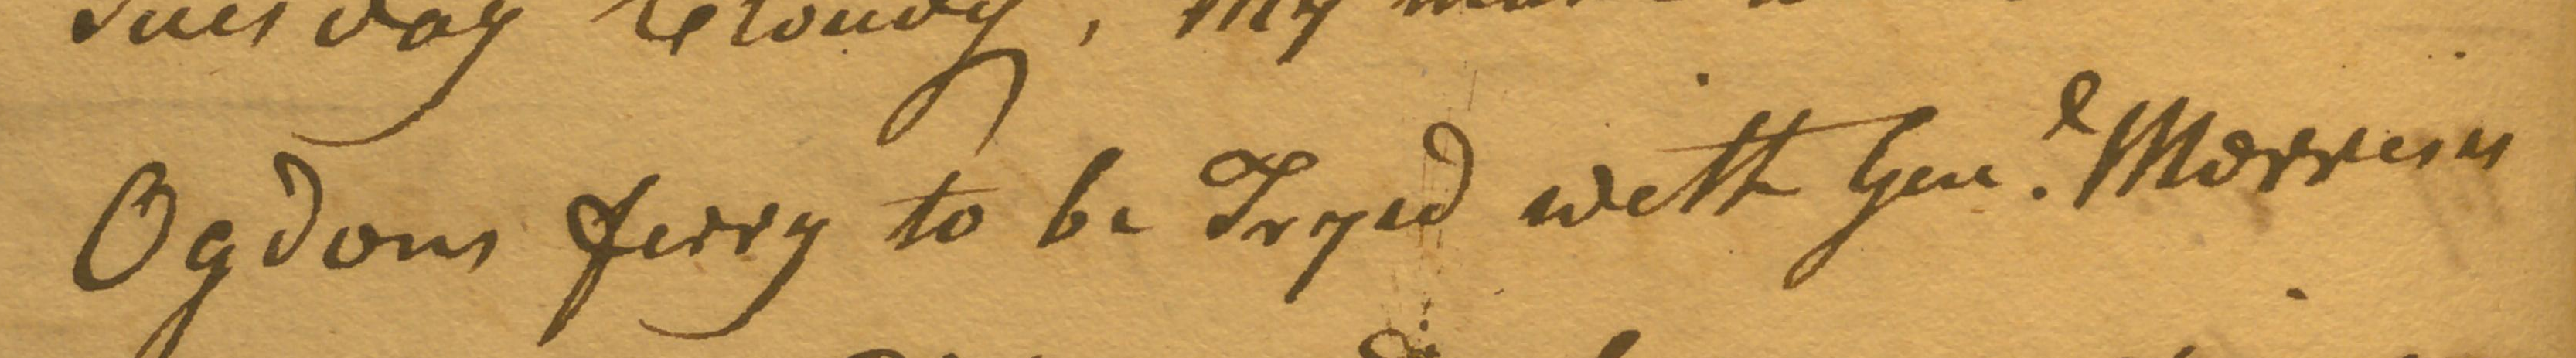Ogdons fersy to be Tryed with Gen^l. Morrises
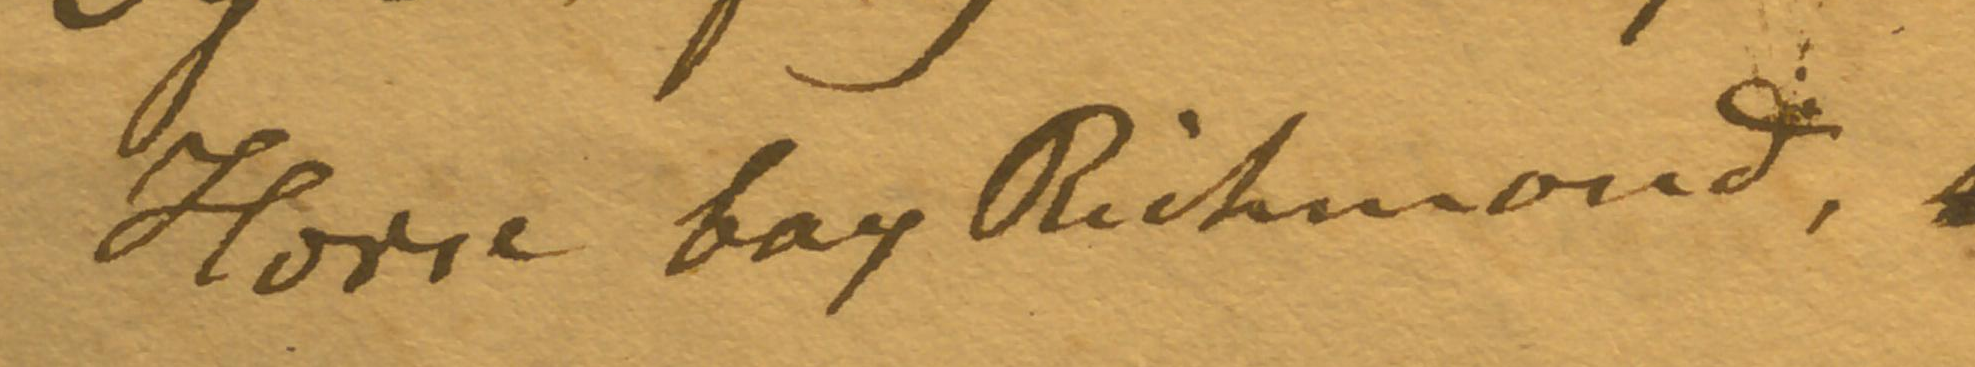Horse bay Richmond,
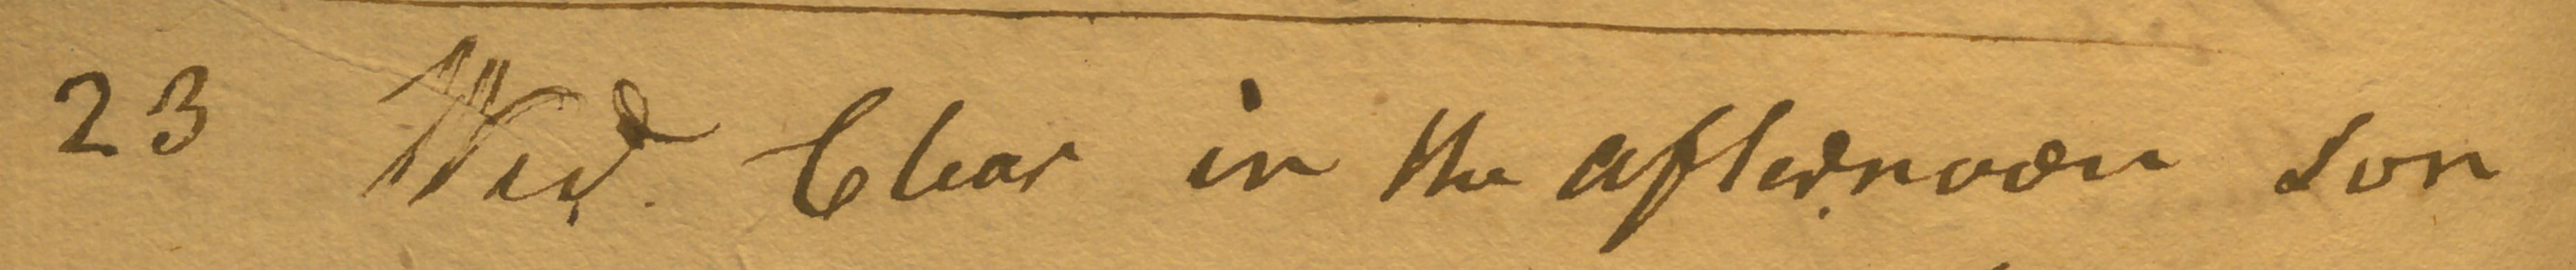23 Wed. Clear in the afternoon son
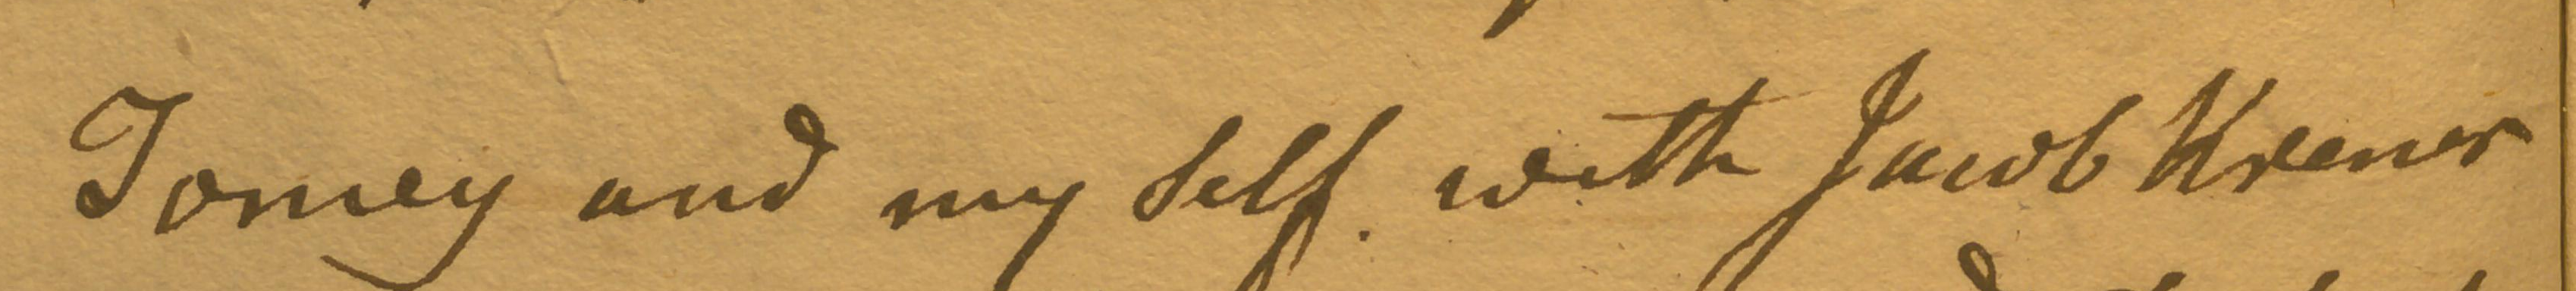Tomey and my self with Jacob Krener
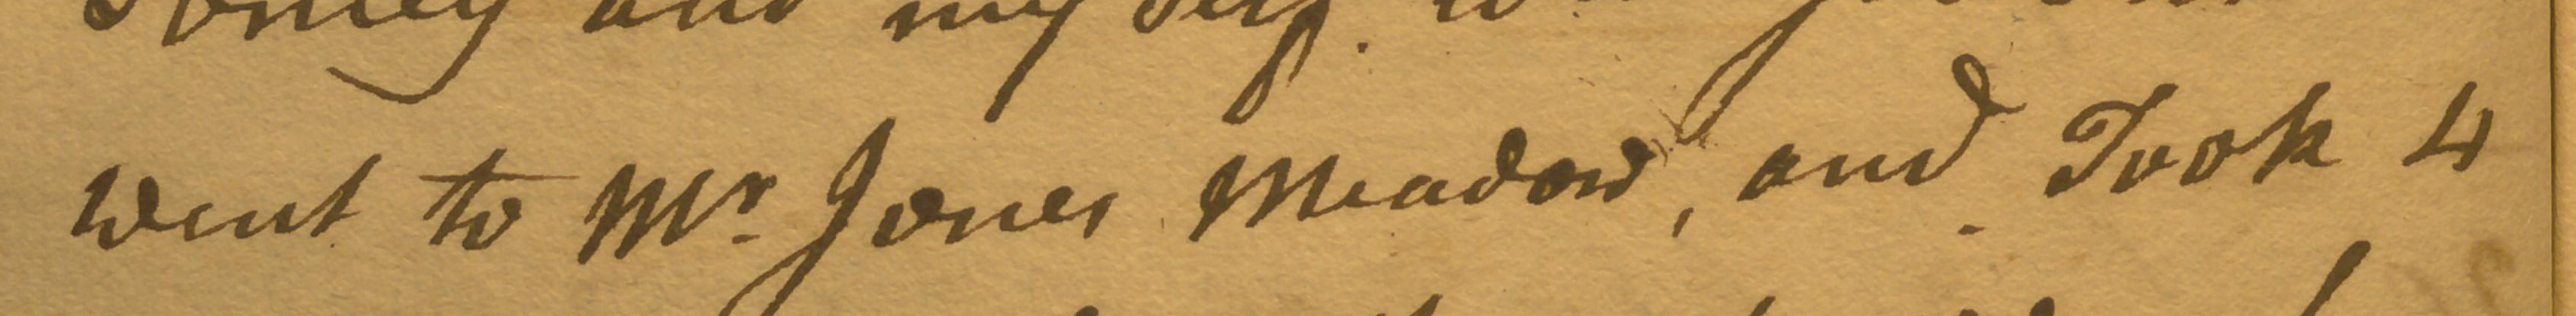went to M^r. Jones Meadow and Took 4
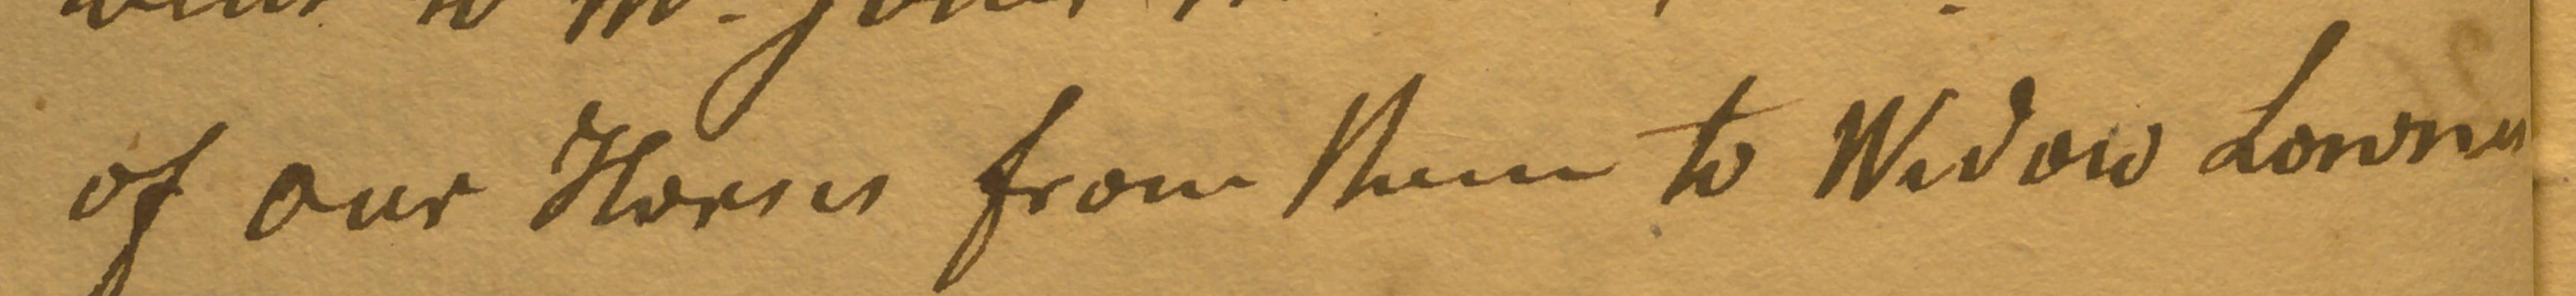of our Horses from them to Widow Lownes
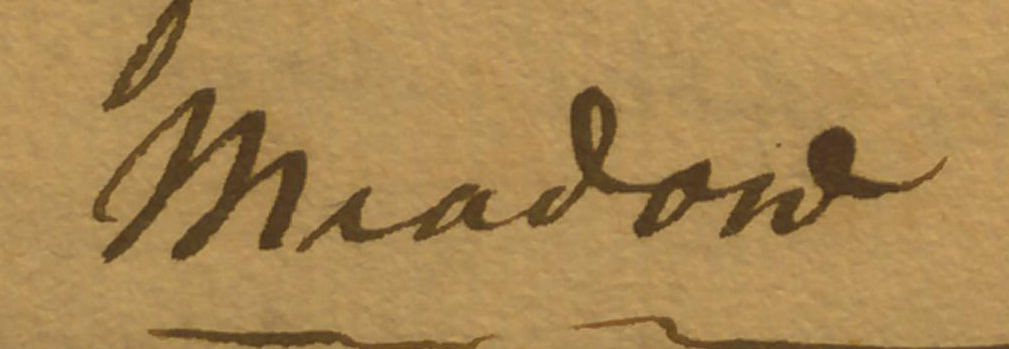Meadow
